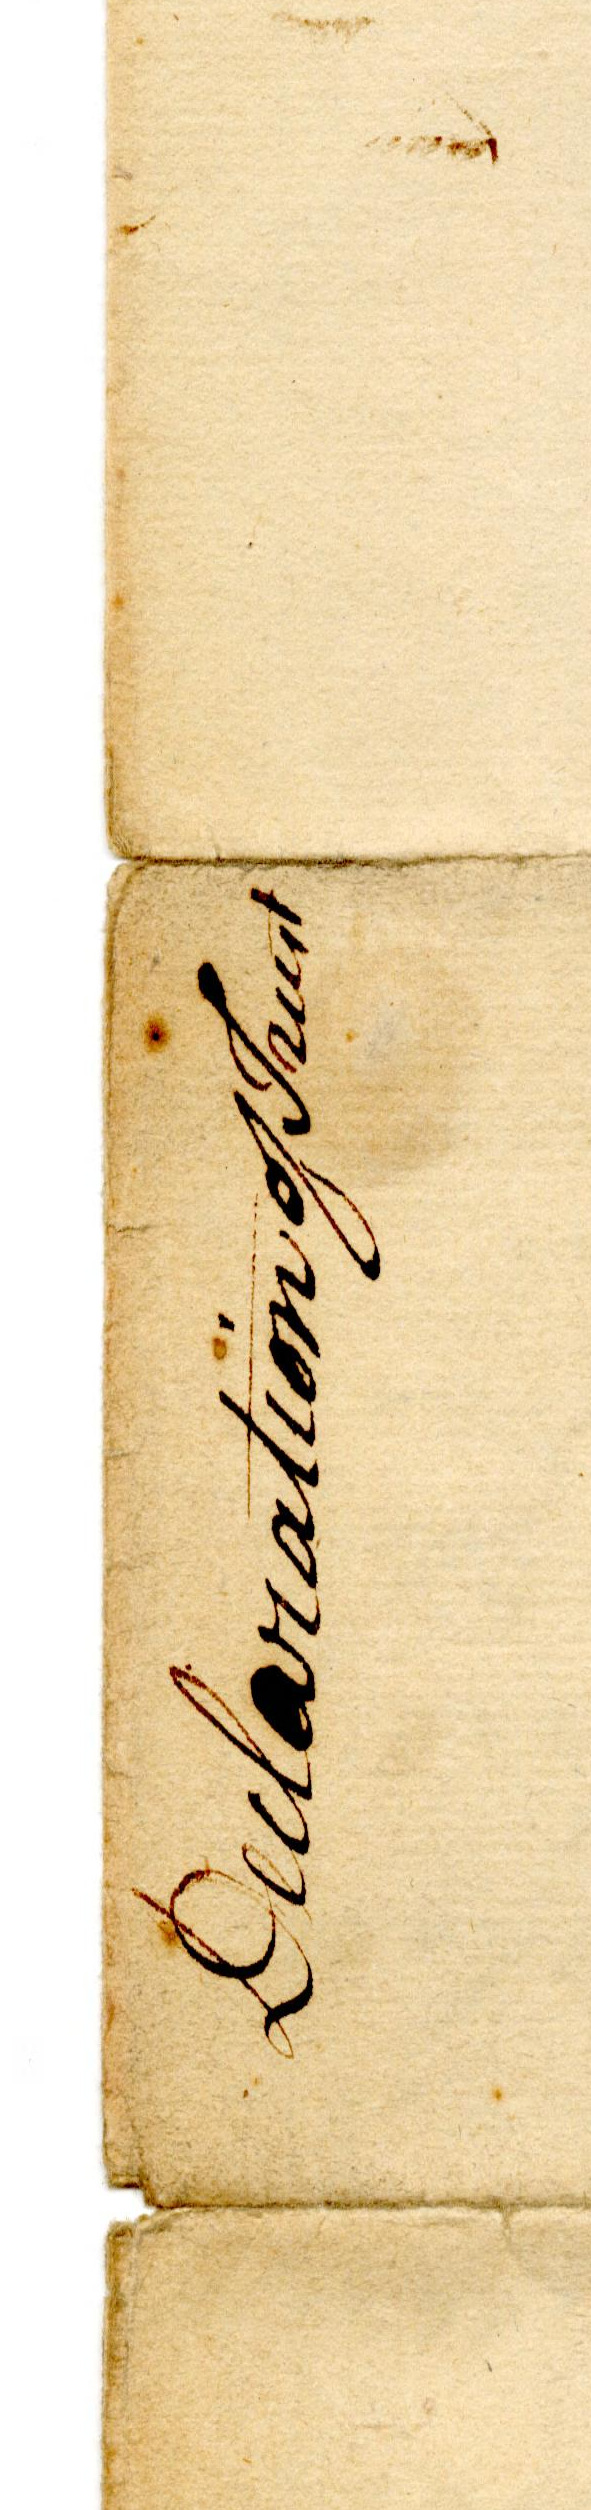Declaration of Tract
